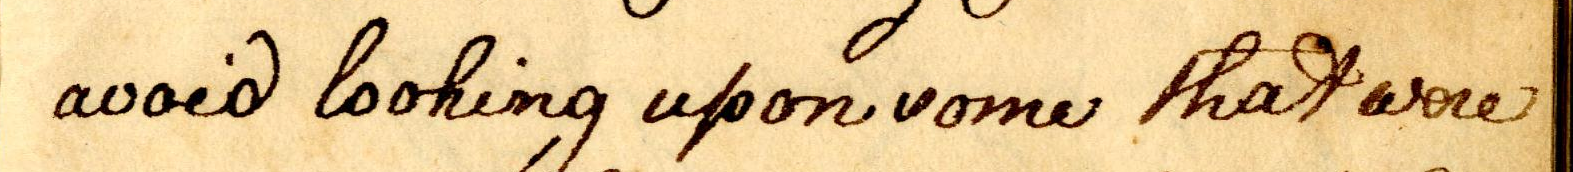avoid looking upon some that were
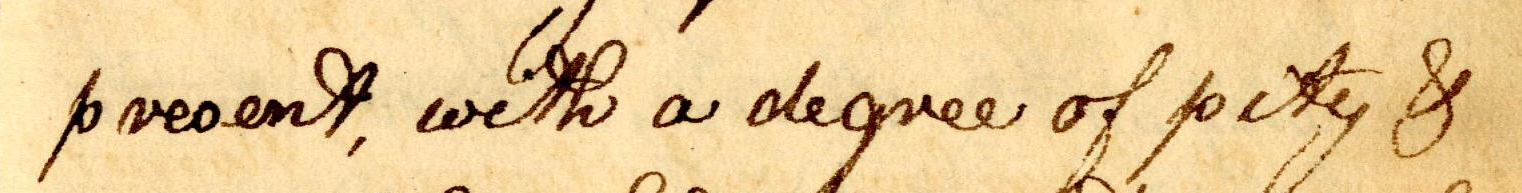present, with a degree of pity &
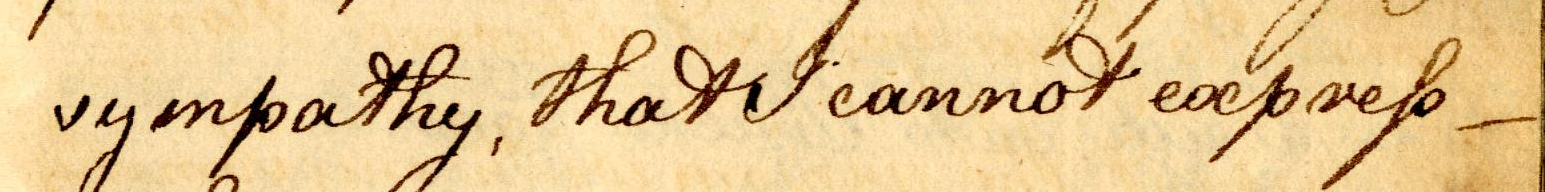sympathy, that I cannot express-
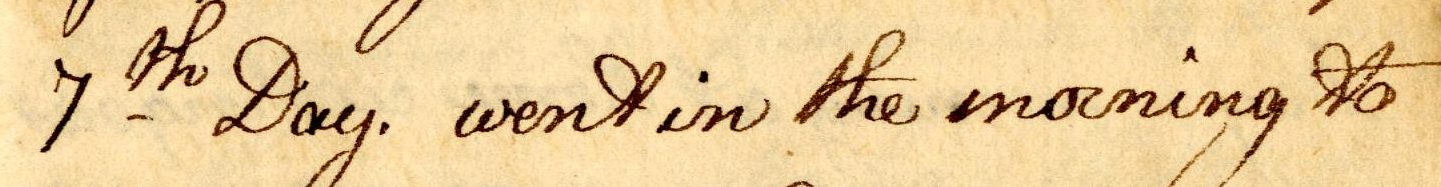7^th Day. went in the morning to
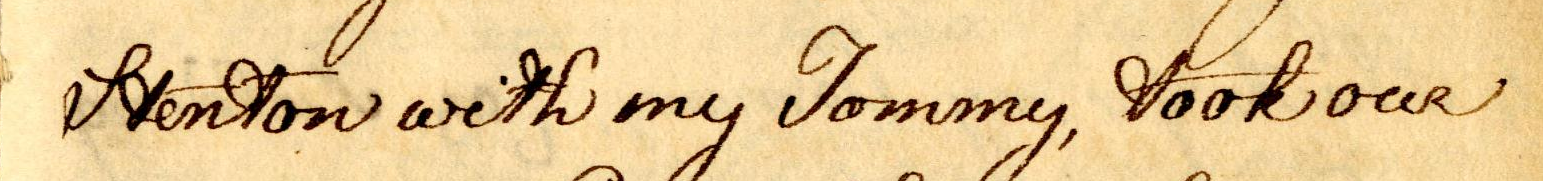Stenton with my Tommy, took our
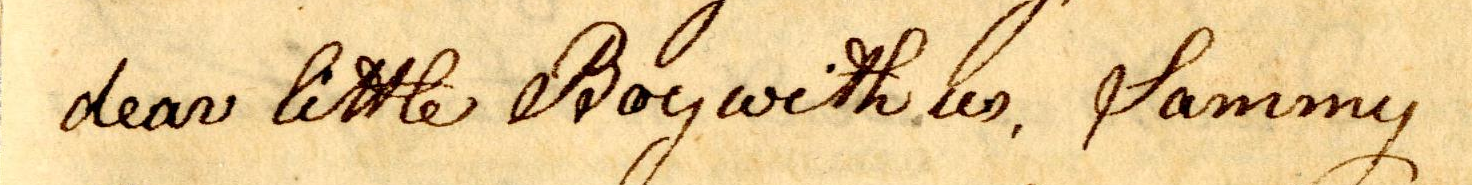dear little Boy with us, Sammy
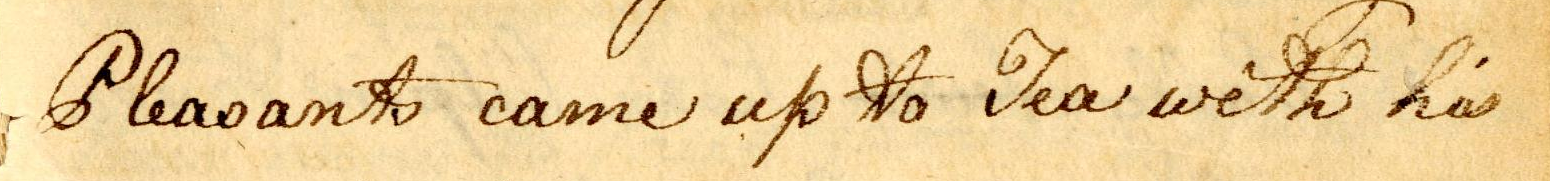Pleasants came up to Tea with his
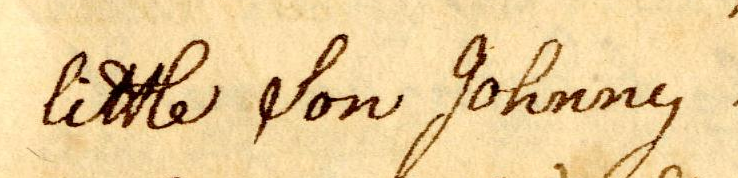little Son Johnny
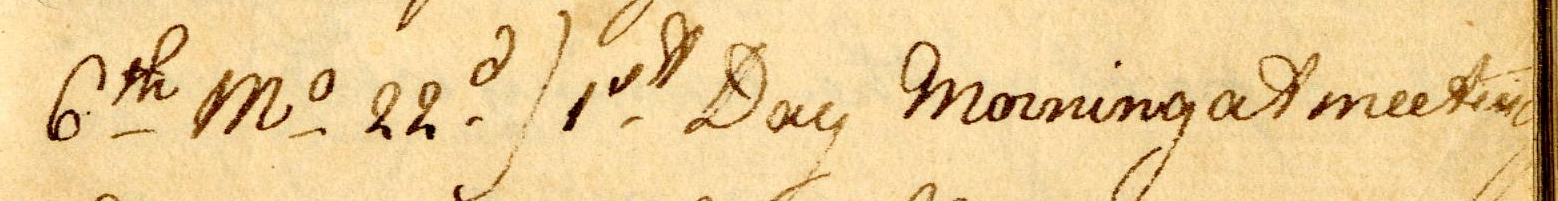6^th M^o 22^d.) 1^st Day Morning at meeting
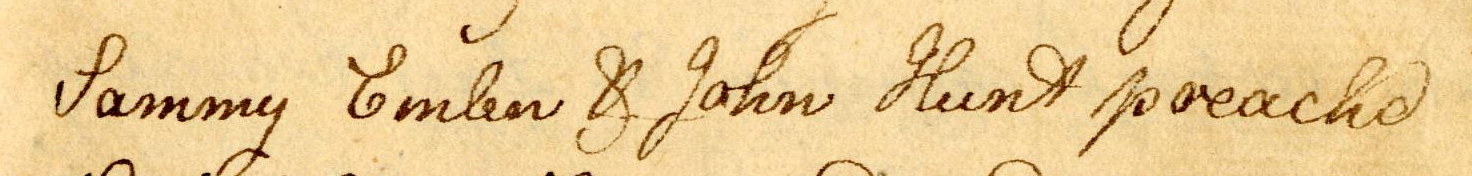Sammy Emlen & John Hunt preachd
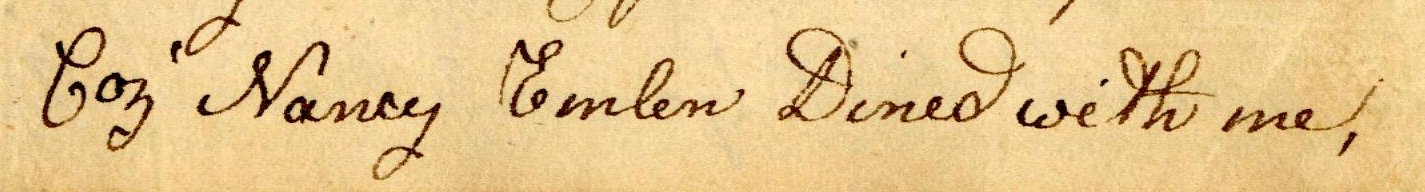Coz' Nancy Emlen Dined with me,
